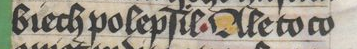biech polepẛil.Ale to co
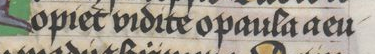opiet vidite opaula a eu¬
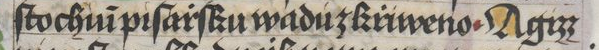stochui piſaṙẛku wadú zkṙiweno.A gizz
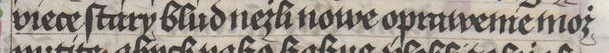víecze ſtary blud neżli nowe oprawenie moż¬
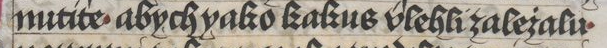nutite.abych yako kakus vlehli zależalu.
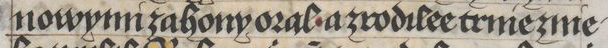nowymi zakony ozal.a zrodilee trníe z nie¬
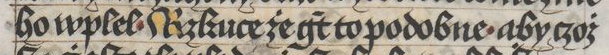ho ſoplel.Rzkuce że ḡt to podobne.aby czoż
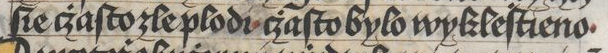ſie cżaſto zle plodi.cżaſto bylo wykleẛtieno.
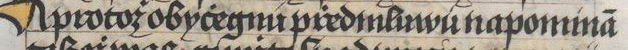A protož obyċegnú pṙedmluwú naopmina
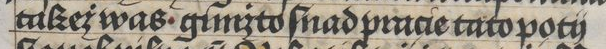takteż was.gimżto ſnad pracie tato potij¬
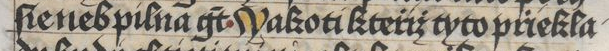ſie neb pilna ḡt.Yakoti kteṙíż tyto pṙiekla¬
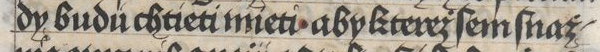dy budú chtieti mieti.aby kterež ſem ſnaž¬
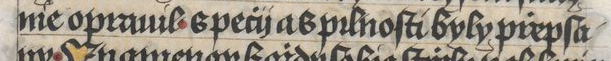nie opravil.s pečij a s pilnoſtí byly pṙiepſa¬
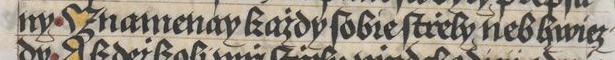ny.Znamenay každy ſobie ſtṙely neb hwiez¬
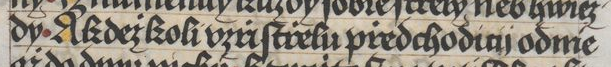dy.A kdeżkoli uzṙi ſtṙelu pṙedchodícij odníe
